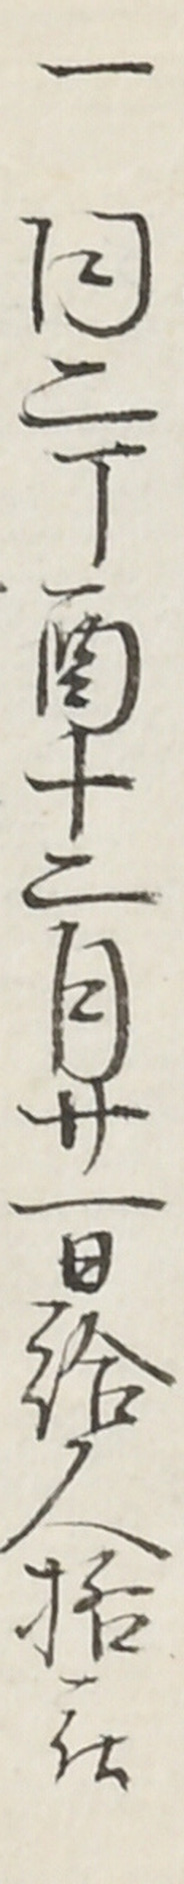一同二丁酉十二月廿一日給人格被
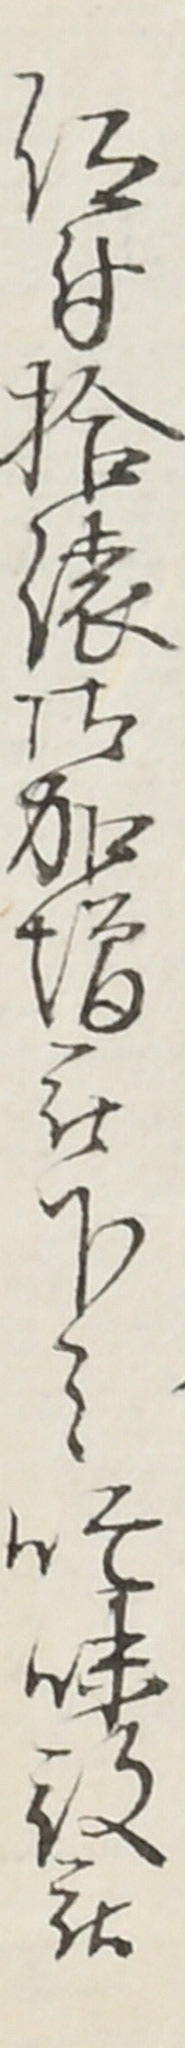仰付拾俵御加増被下之吟味役被
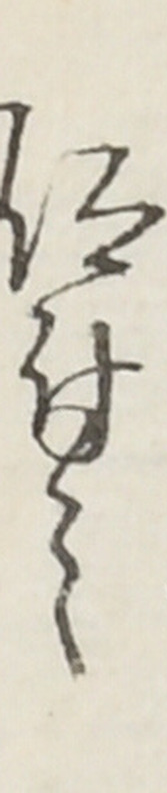仰付之
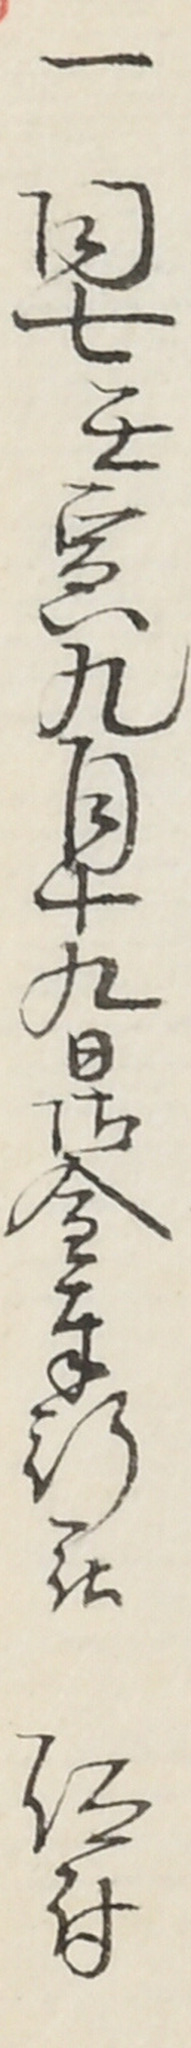一同七壬寅九月十九日御金奉行被仰付

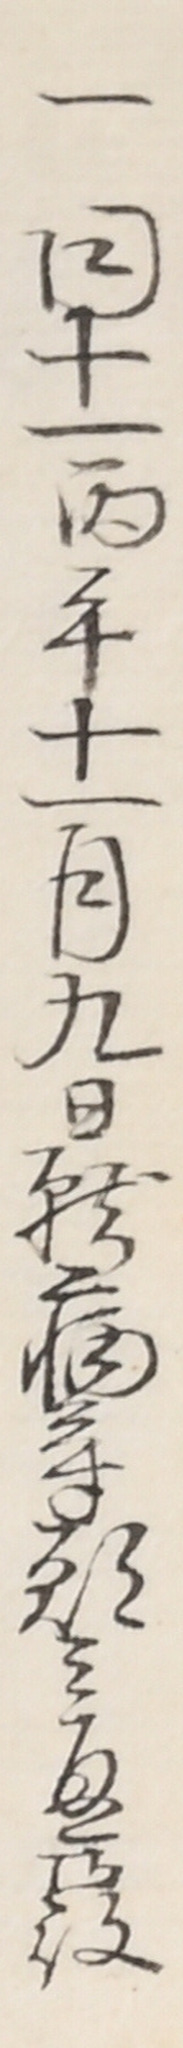一同十一丙午十一月九日就病気願之通御役
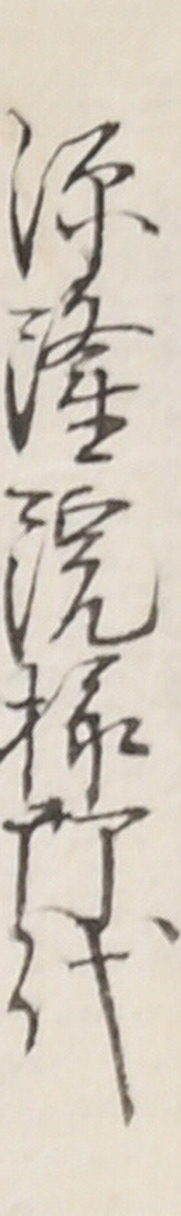源隆院様御代
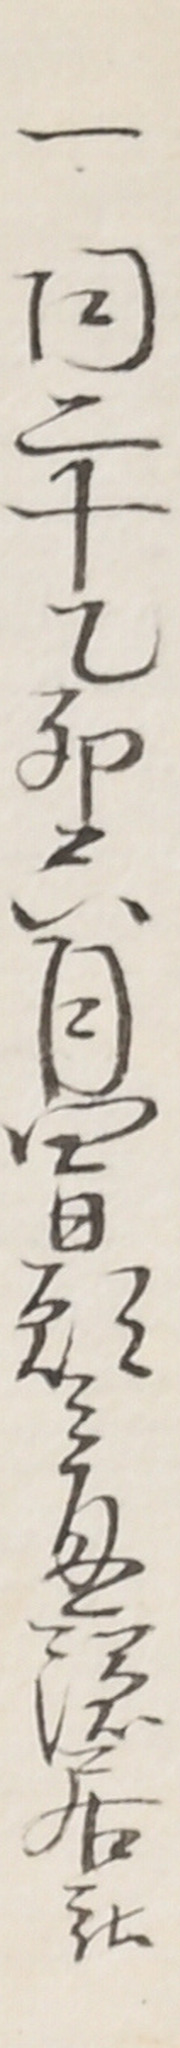一同二十乙卯六月四日願之通隠居被
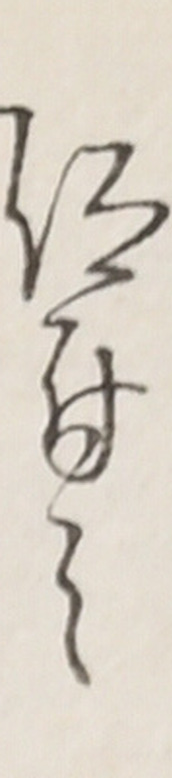仰付之
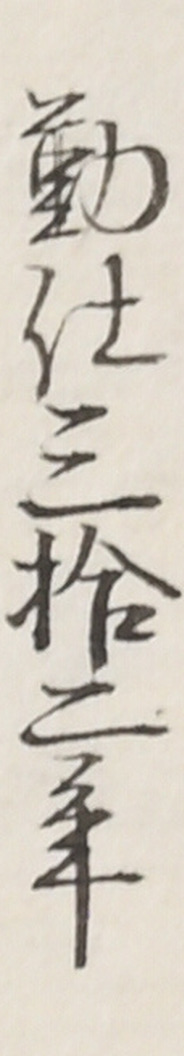勤仕三拾二年
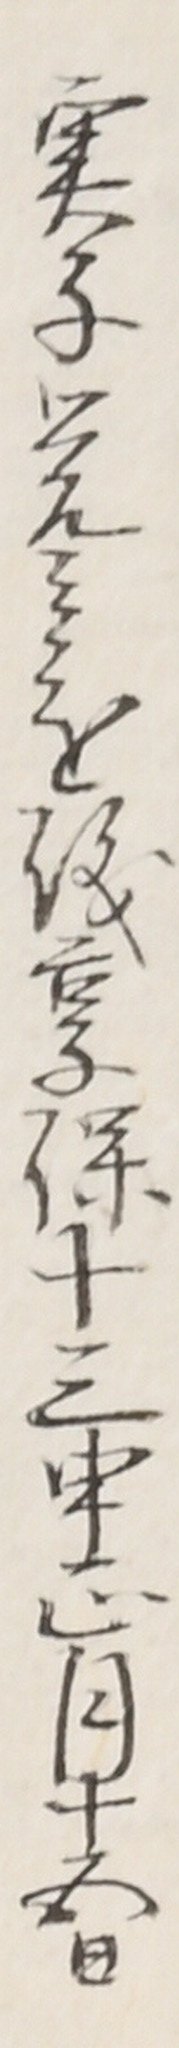実子覚之進儀享保十三申正月十五日
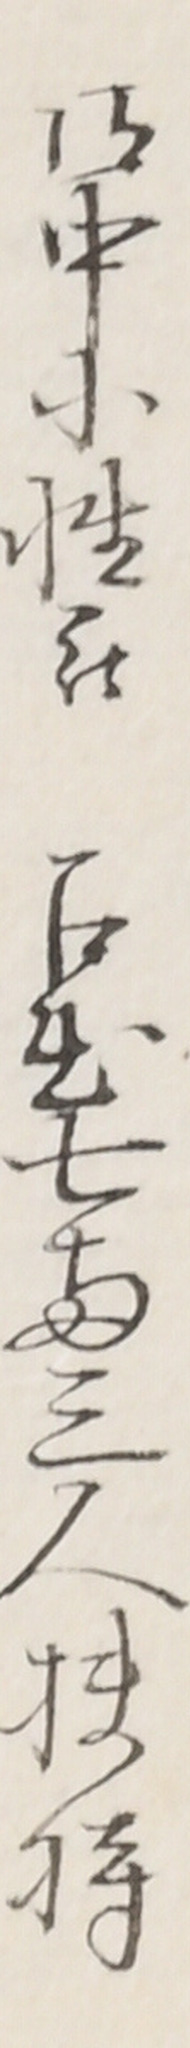御中小性被召出七両三人扶持
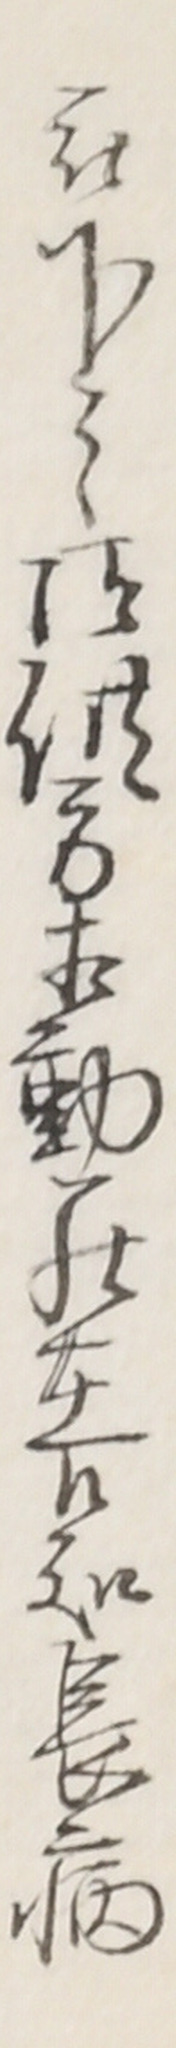被下之御供方相勤罷在候処長病
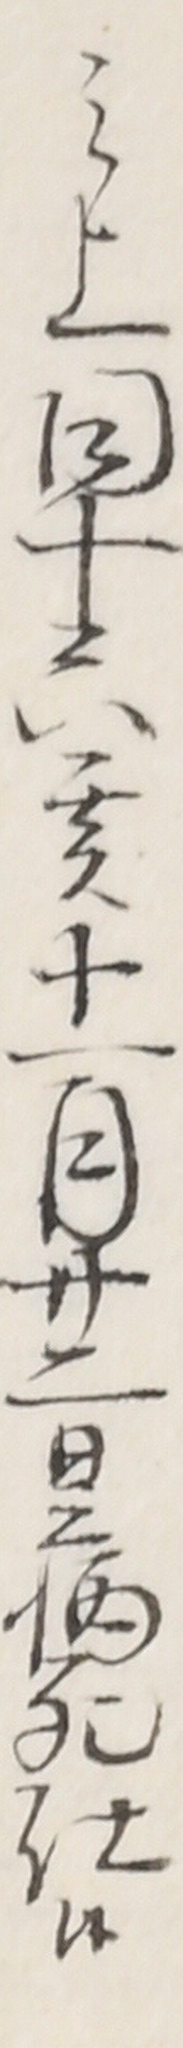之上同十六亥十一月廿二日病死仕候
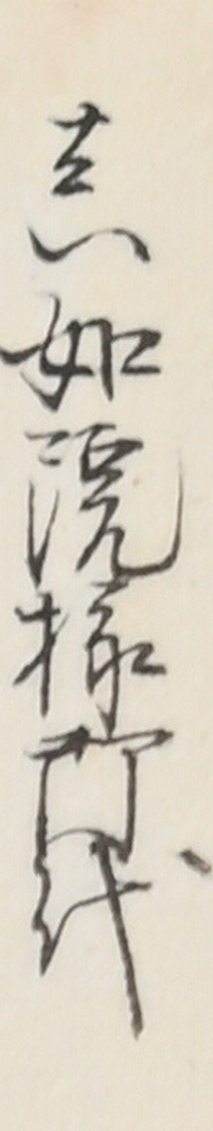真如院様御代
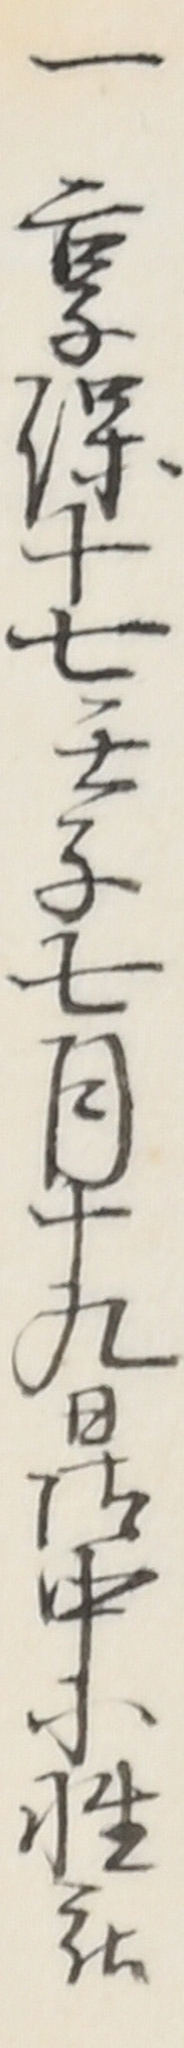一享保十七壬子七月十九日御中小性被
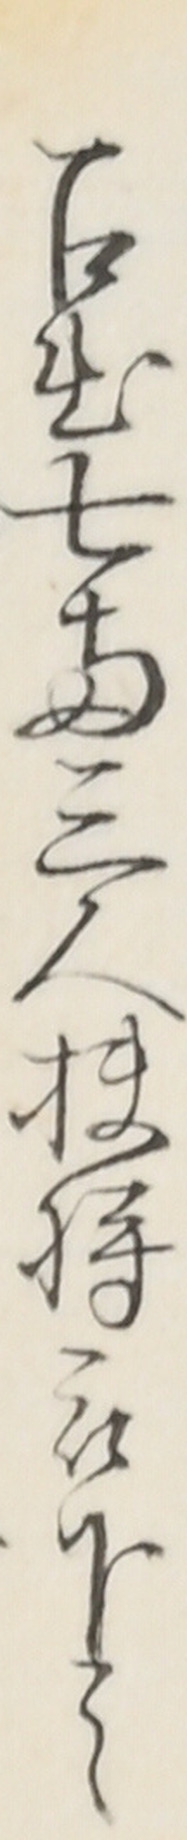召出七両三人扶持被下之
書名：給人諸士勤仕録（七）
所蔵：伊那市立高遠町図書館・合同会社AMANE
